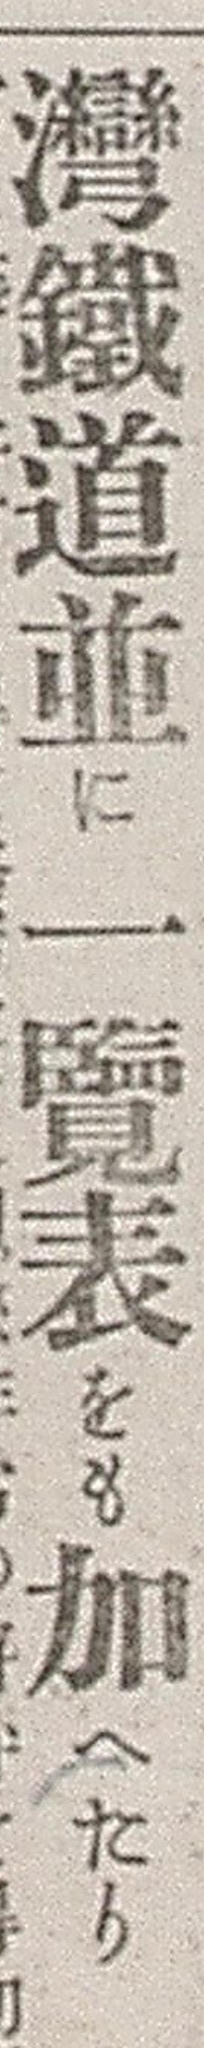湾鉄道並に一覧表をも加へたり
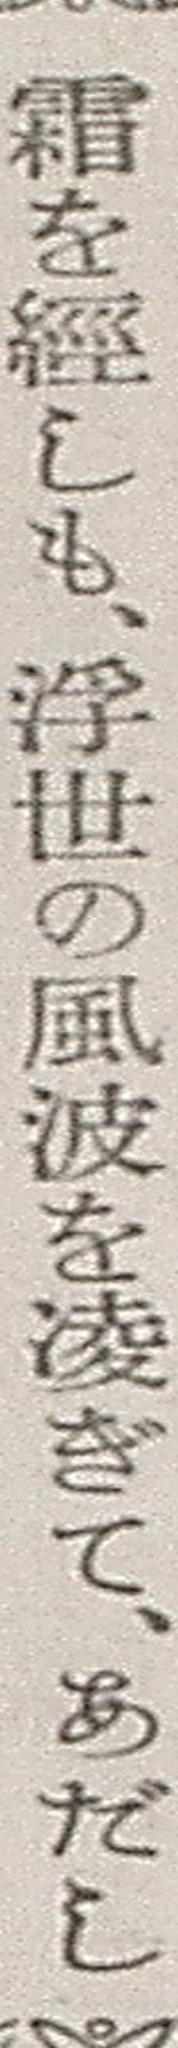霜を経しも、浮世の風波を凌ぎて、あだし
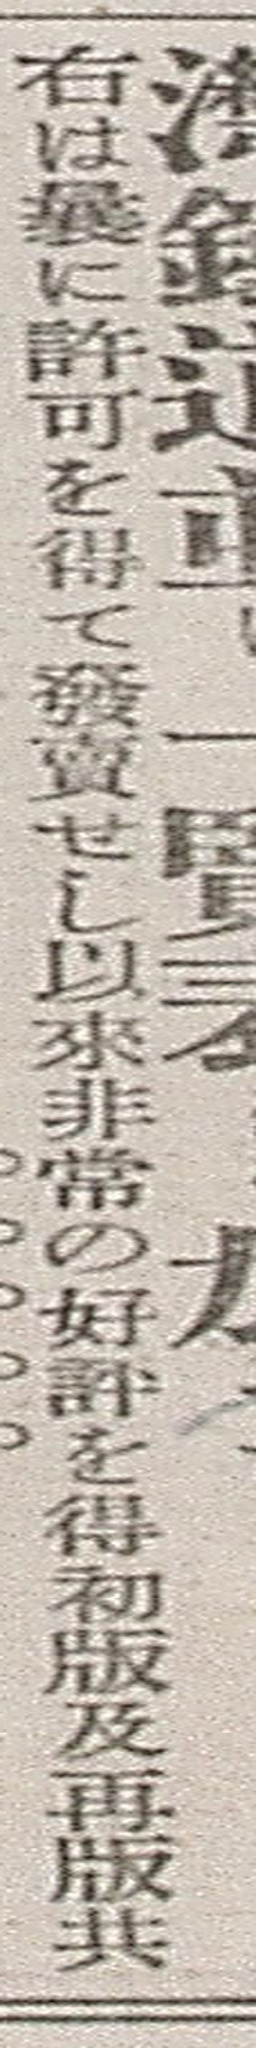右は曩に許可を得て発売せし以来非常の好評を得初版及再版共
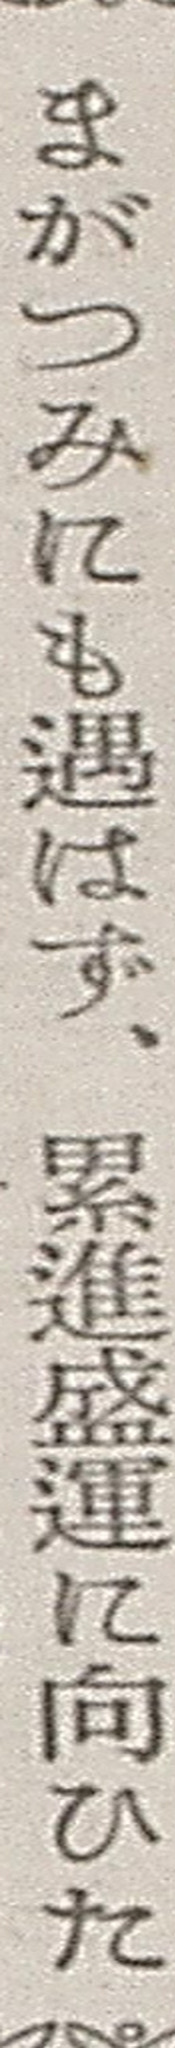まがつみにも遇はず、累進盛運に向ひた
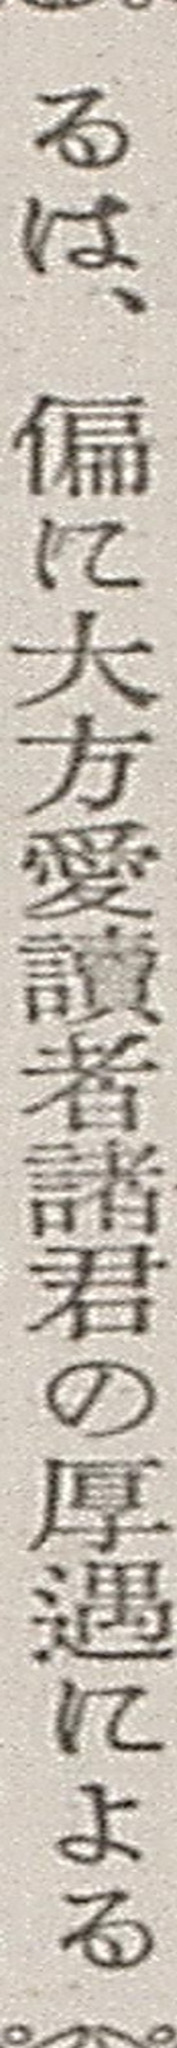るは、偏に大方愛読者諸君の厚遇による
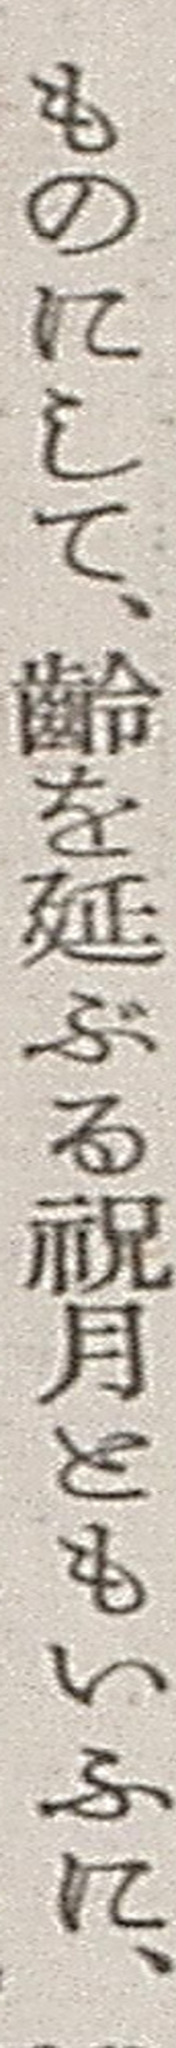ものにして、齢を延ぶる祝月ともいふに、
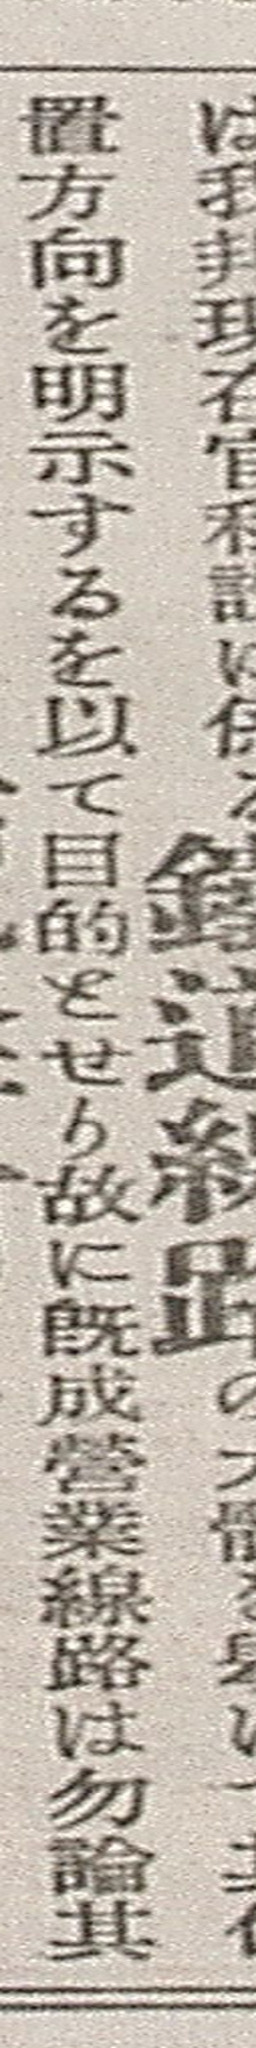置方向を明示するを以て目的とせり故に既成線路は勿論其
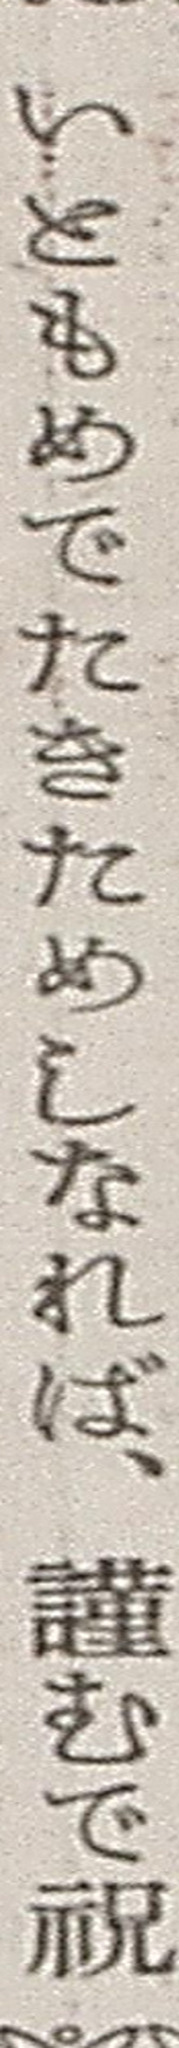いともめでたきためしなれば、謹むで祝
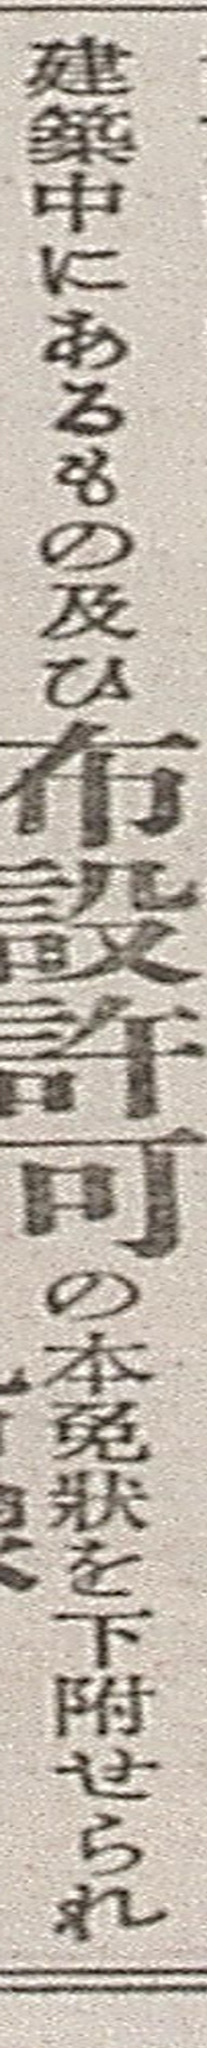建築中にあるもの及び布設許可の本免状を下附せられ
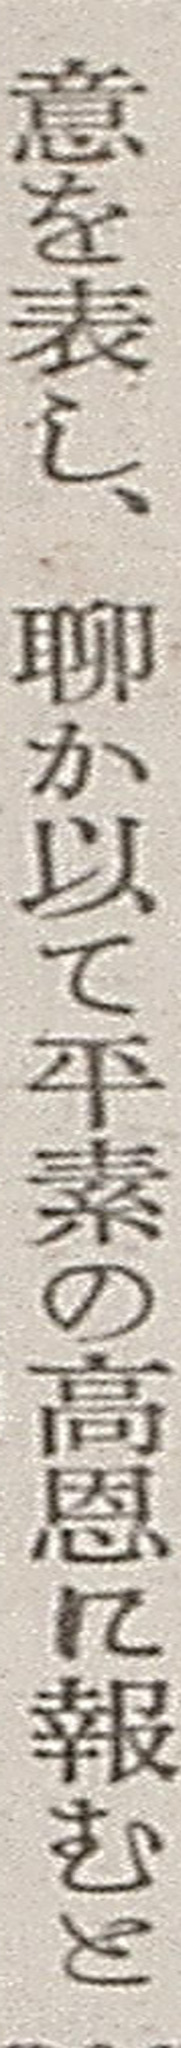意を表し、聊か以て平素の高恩に報むと
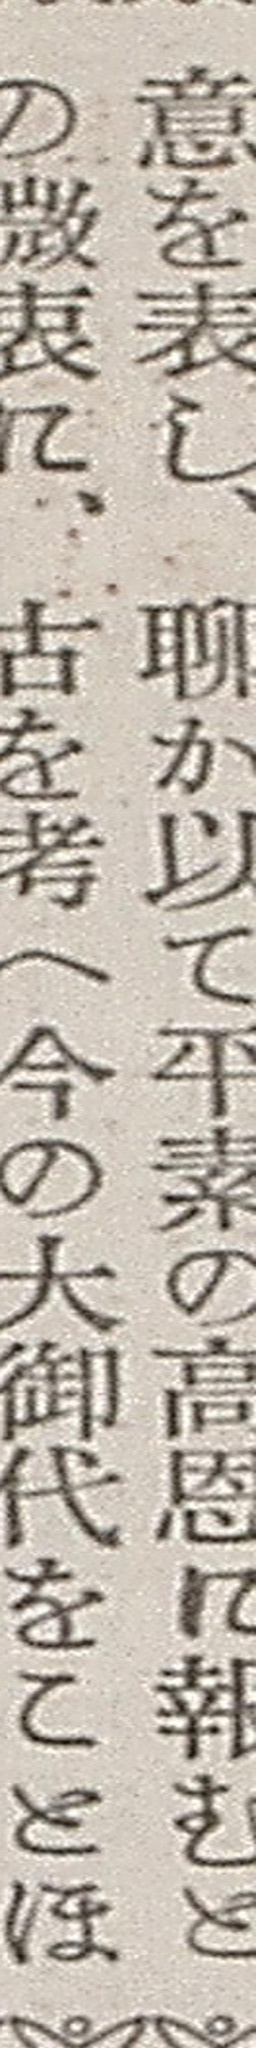の微衷に、古を考へ今の大御代をことほ
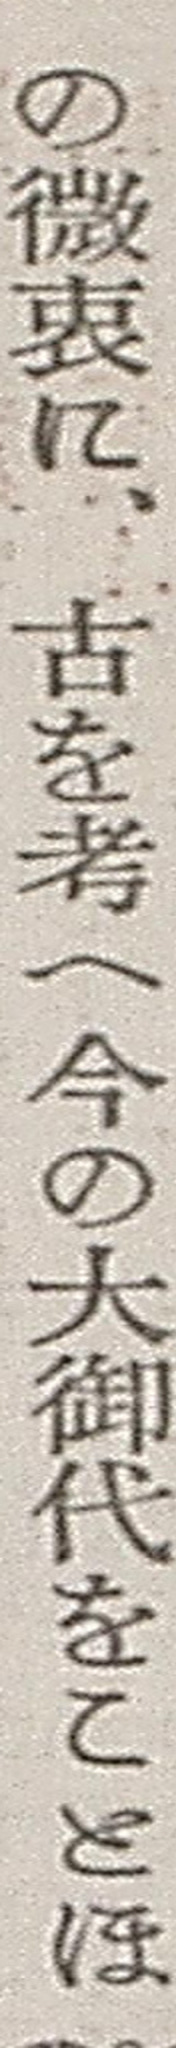の微衷に、古を考へ今の大御代をことほ
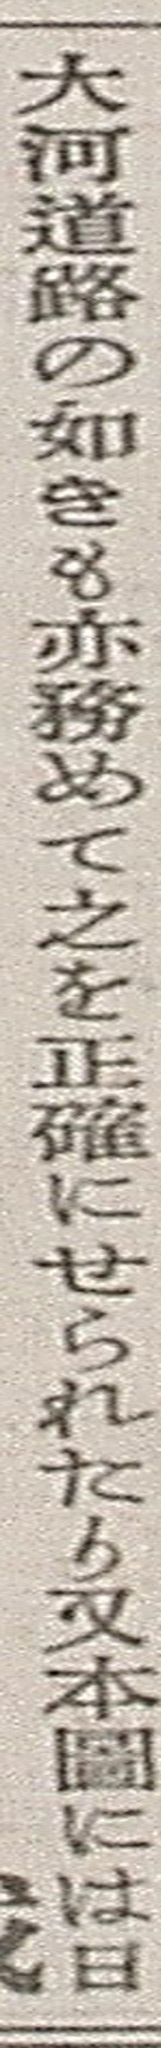大河道路の如きも亦務めて之を正確にせられたり又本図には日
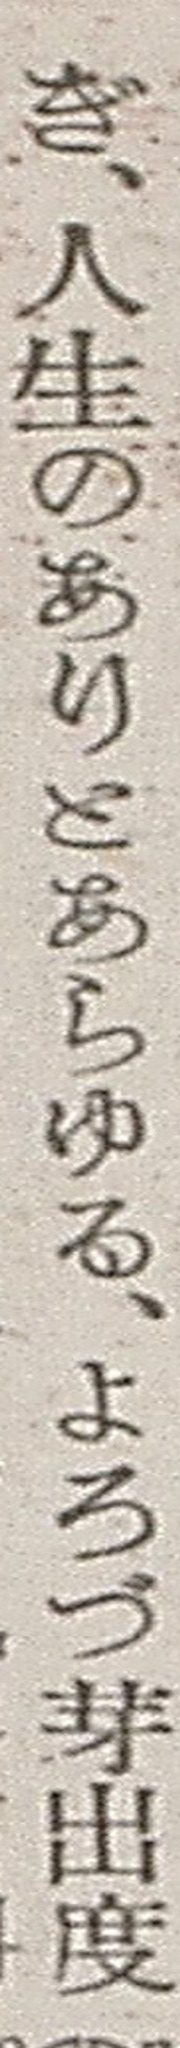ぎ、人生のありとあらゆる、よろづ芽出度
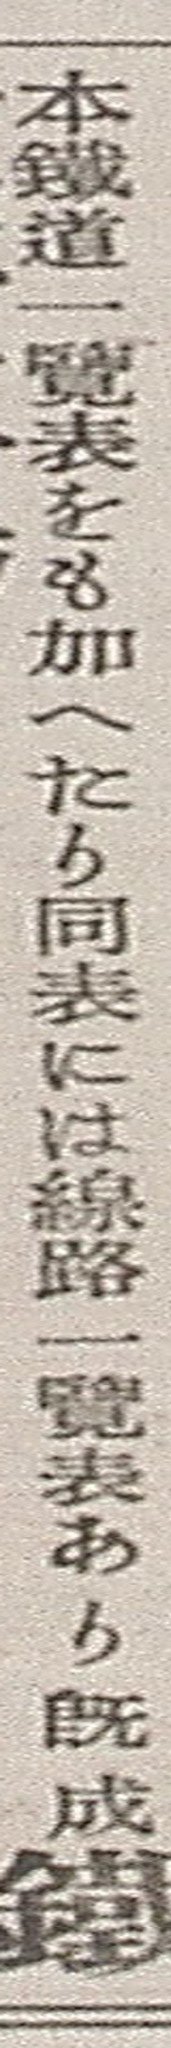本鉄道一覧表をも加へたり同表には線路一覧表あり既成鉄
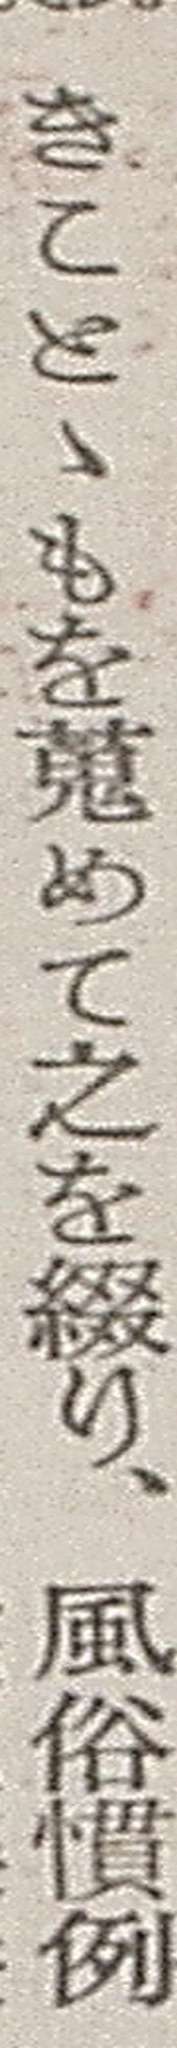きことゝもを蒐めて之を綴り、風俗慣例
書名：風俗畫報臨時増刊第百九十九號　明治三十二年十月各地災害圖會（前編之續）
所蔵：東京大学地震研究所図書室 Earthquake Research Institute Library, The University of Tokyo, JAPAN
